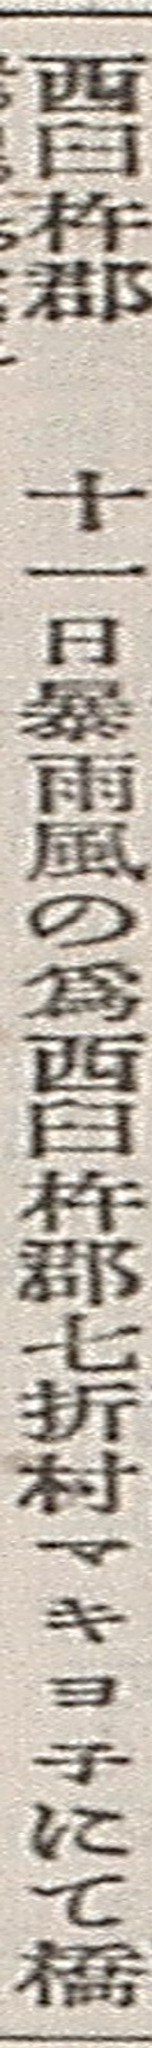西𦥑杵郡十一日暴風雨の為西𦥑杵郡七折村マキヨ子にて橋
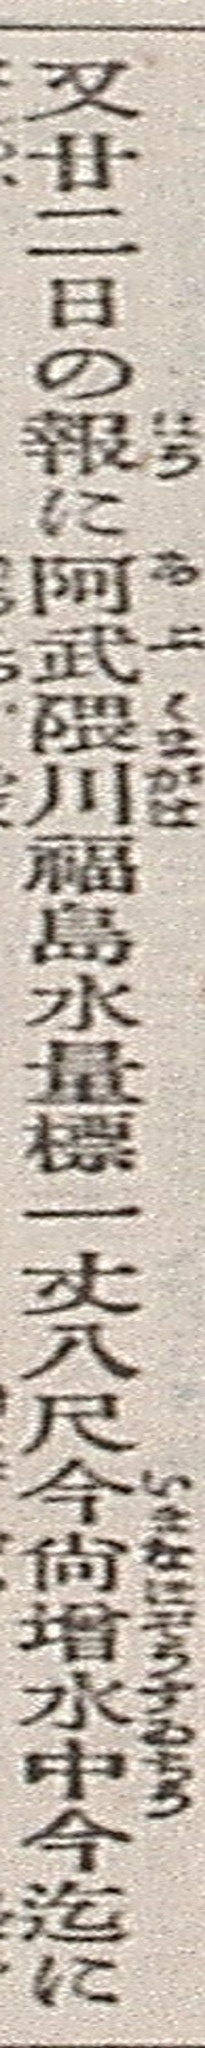又廿二日の報に阿武隈川福島水量標一丈八尺今尚増水中今迄に
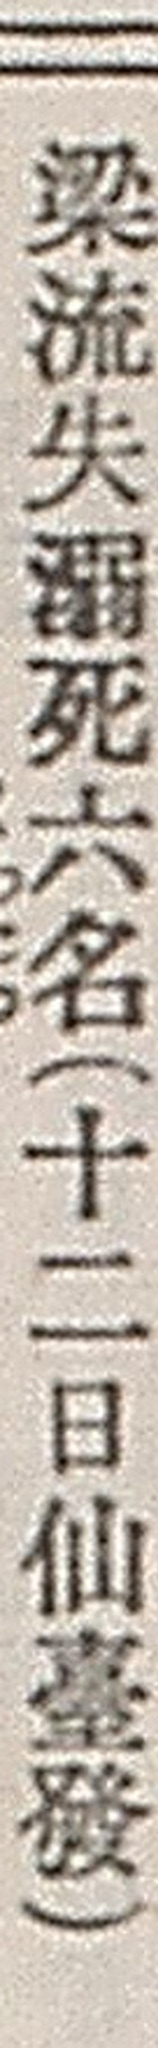梁流失溺死六名
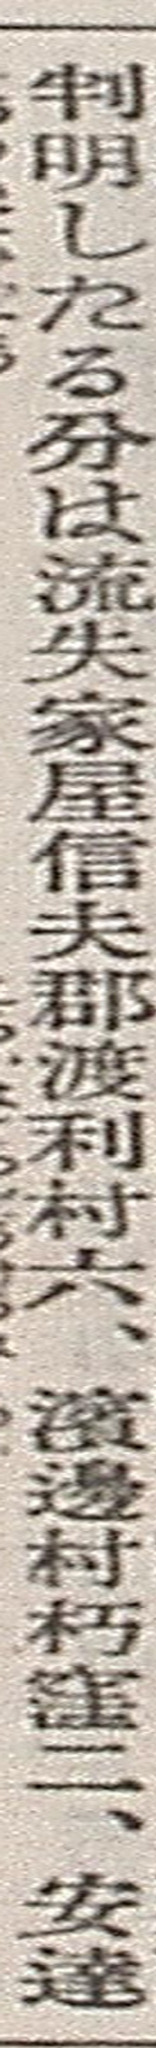判明したる分は流失家屋信夫郡渡利村六、浜辺村朽窪二、安達
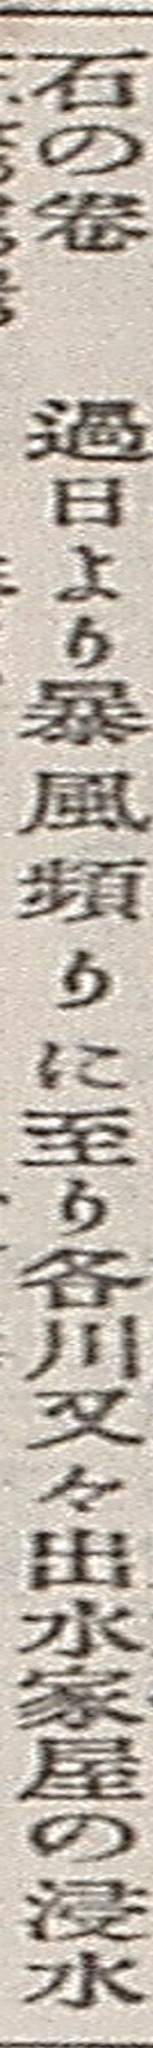石の巻過日より暴風頻りに至り各川又々出水家屋の浸水
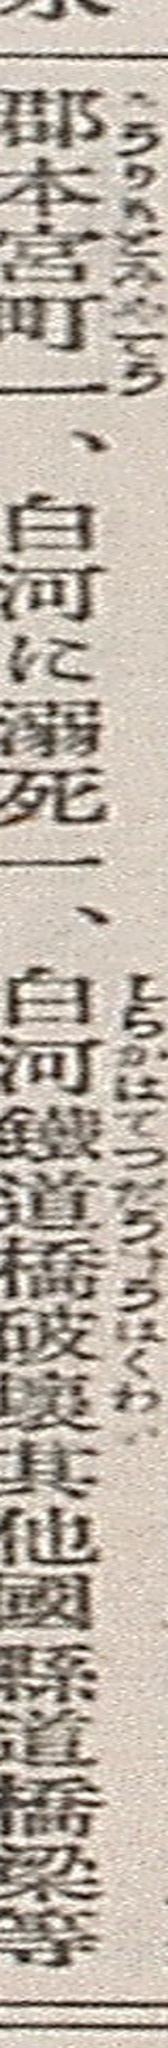郡本宮町一、白河に溺死一、白河鉄道橋破壊其他国道県道橋梁等
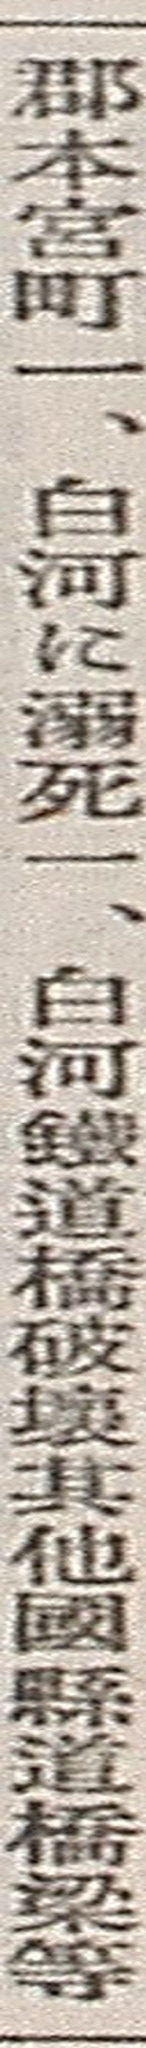郡本宮町一、白河に溺死一、白河鉄道橋破壊其他国道県道橋梁等
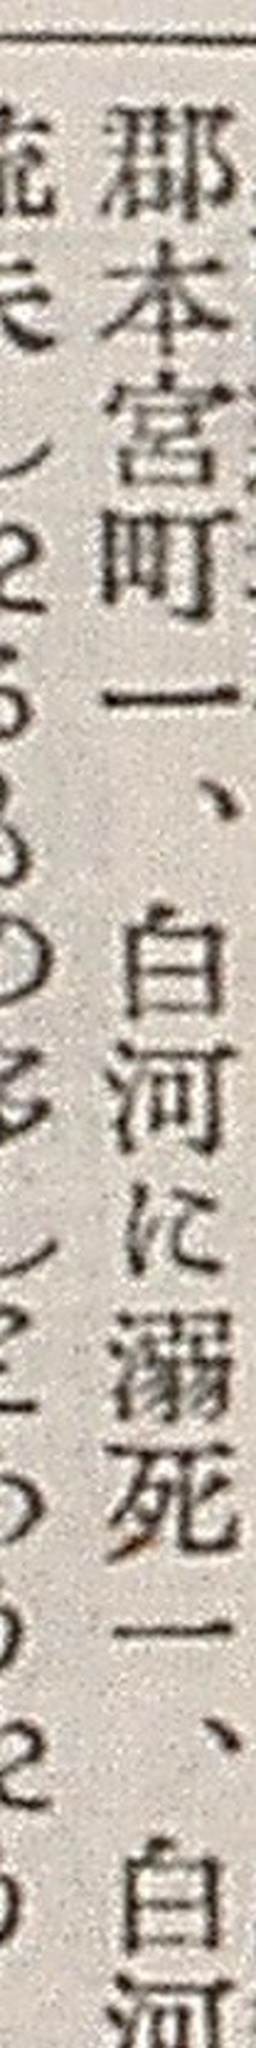流失したるもの多しとありたり
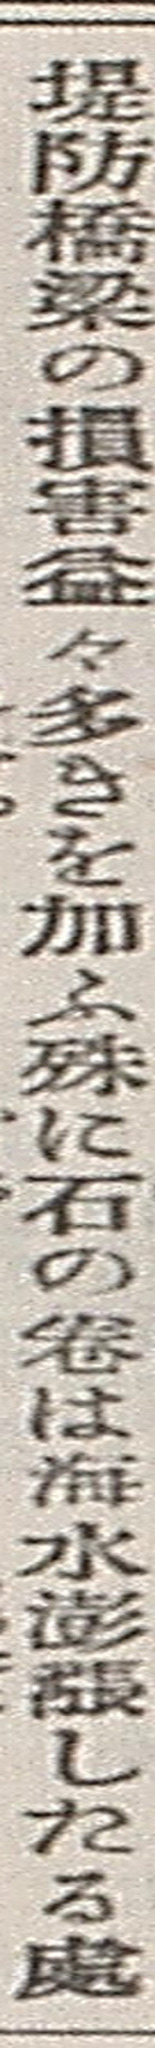堤防橋梁の損害益々多きを加ふ殊に石の巻は海水澎漲したる処
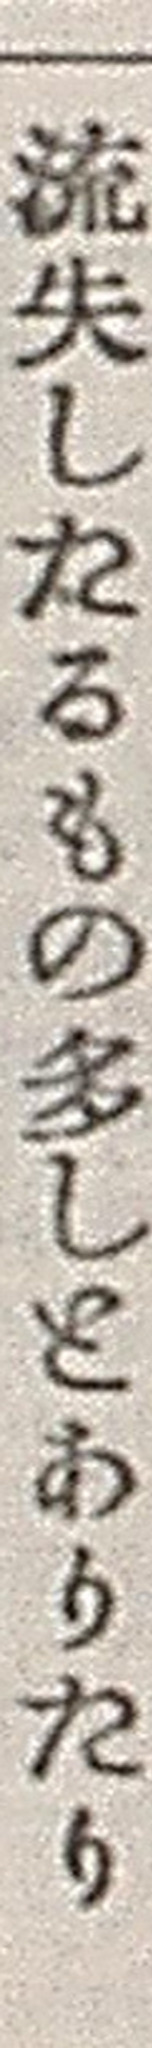流失したるもの多しとありたり
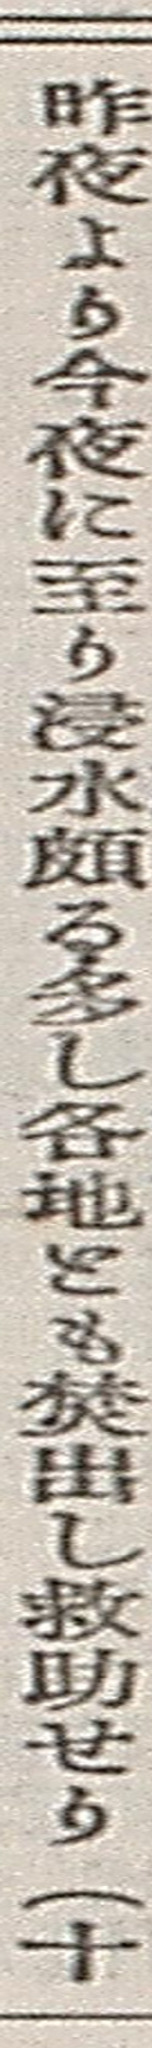昨夜より今夜に至り浸水頗る多し各地とも焚出し救助せり（十
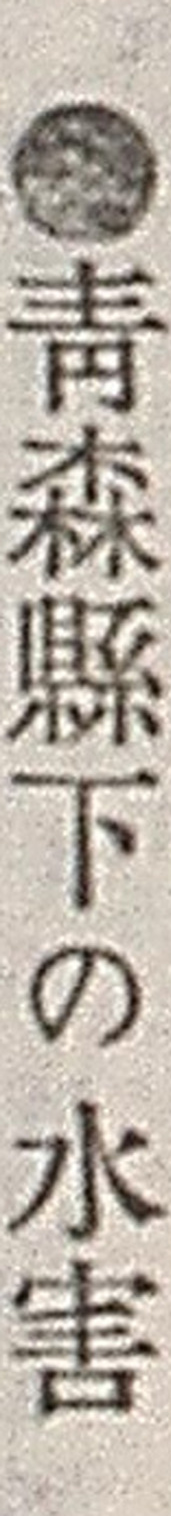●青森県下の水害
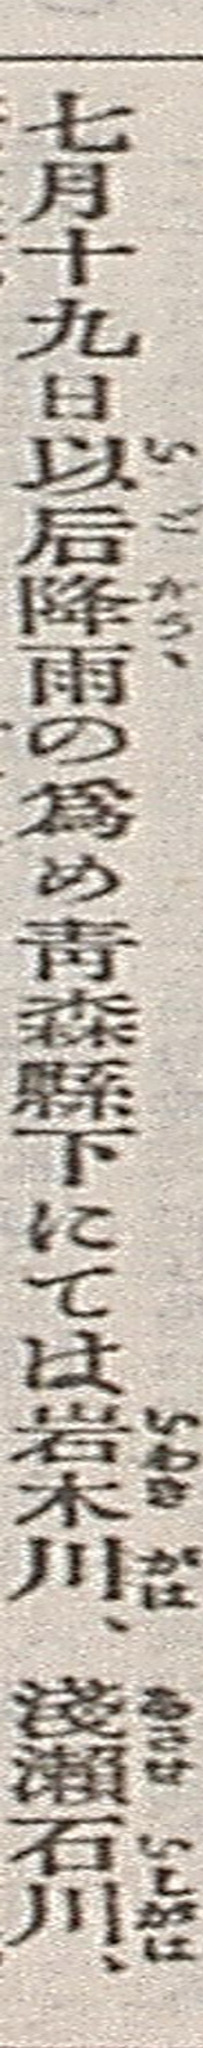七月十九日以後降雨の為め青森県下にては岩木川、浅瀬石川、
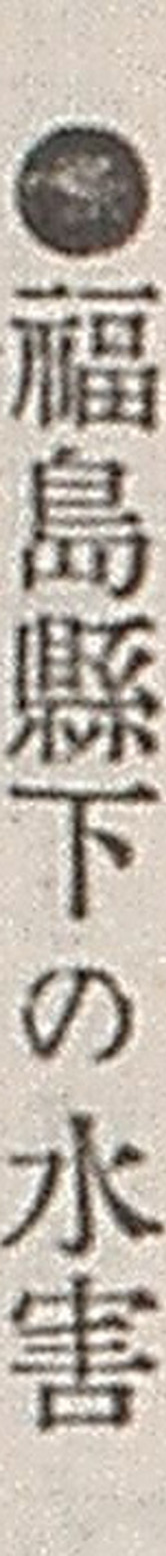●福島県下の水害
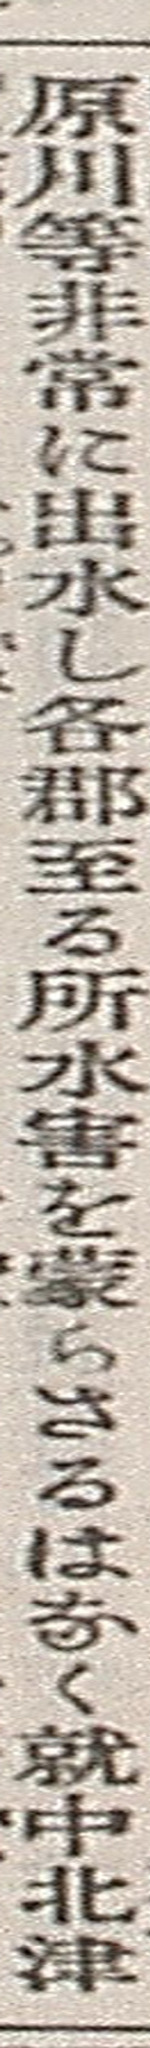原川等非常に出水し各郡至る所水害を蒙らざるはなく就中北津
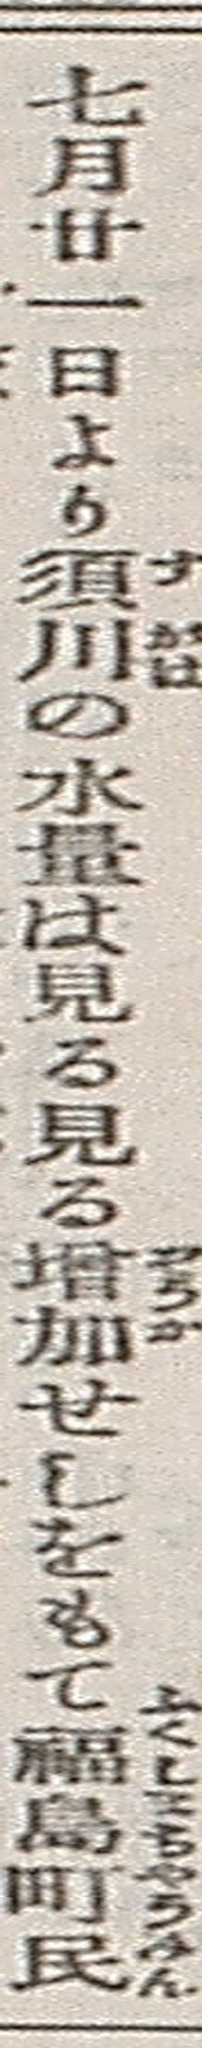七月廿一日より須川の水量は見る見る増加せしをもて福島町民
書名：風俗畫報臨時増刊第百二十八號　洪水被害録（下）
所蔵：東京大学地震研究所図書室 Earthquake Research Institute Library, The University of Tokyo, JAPAN
